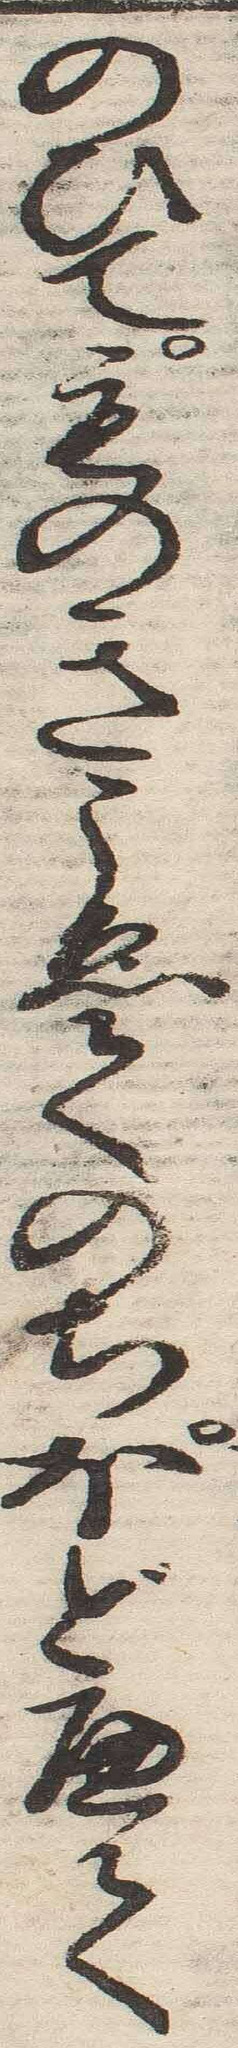のひて。ものきこゑてのち。ほどへて
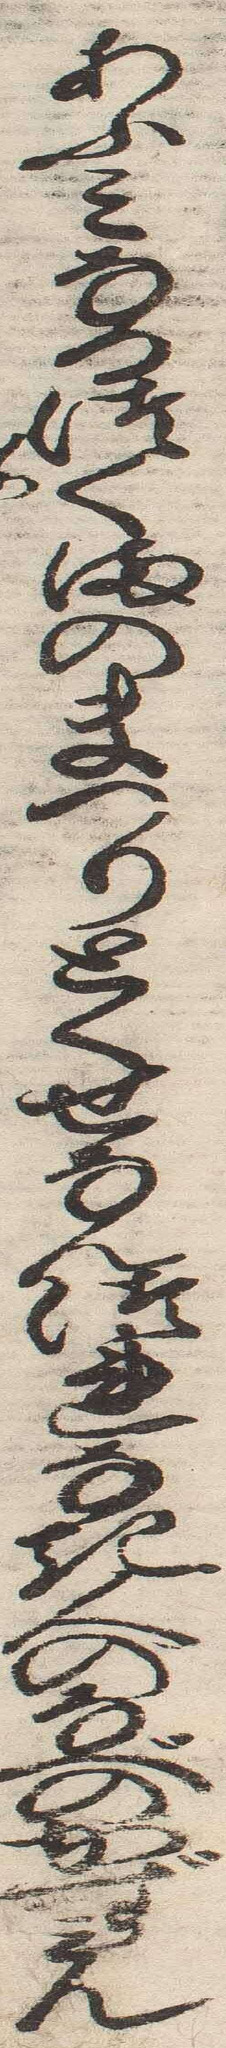あふみなるつくまのまつりとくせなんつれなき人のなべのかずみん
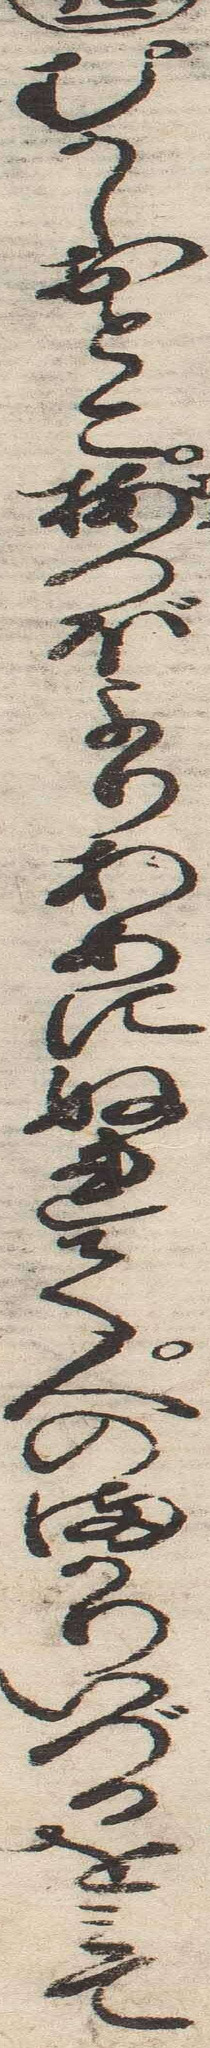百廿一むかしおとこ。梅つぼよりあめにぬれて。人のまかりいづるをみて
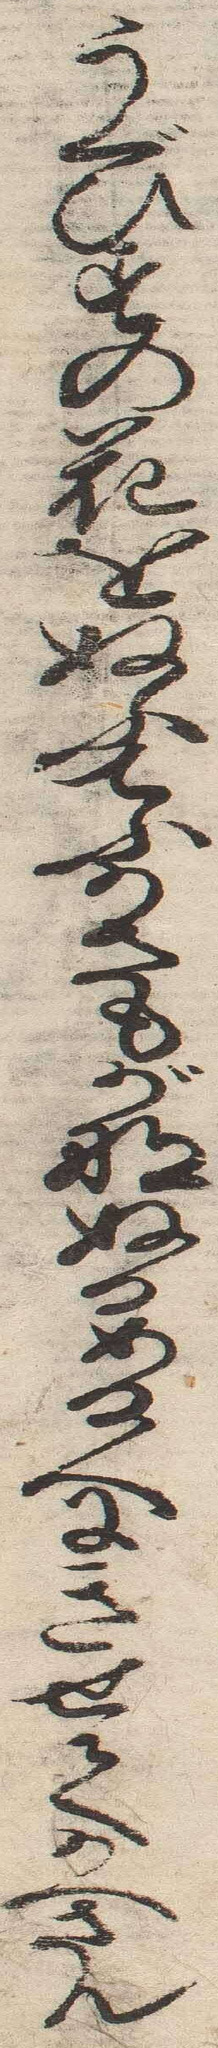うぐひすの花をぬふてふかさもがなぬるめる人にきせてかへさん

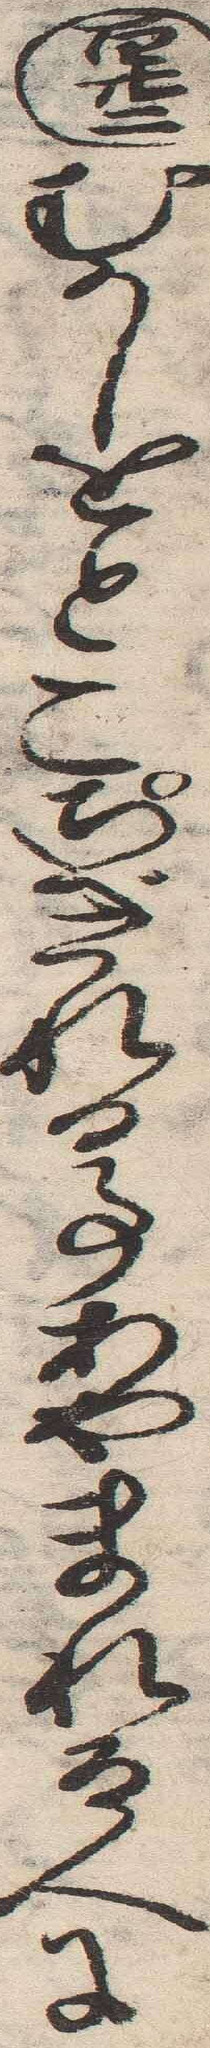百廿二むかしをとこ。ちぎれる事あやまれる人に
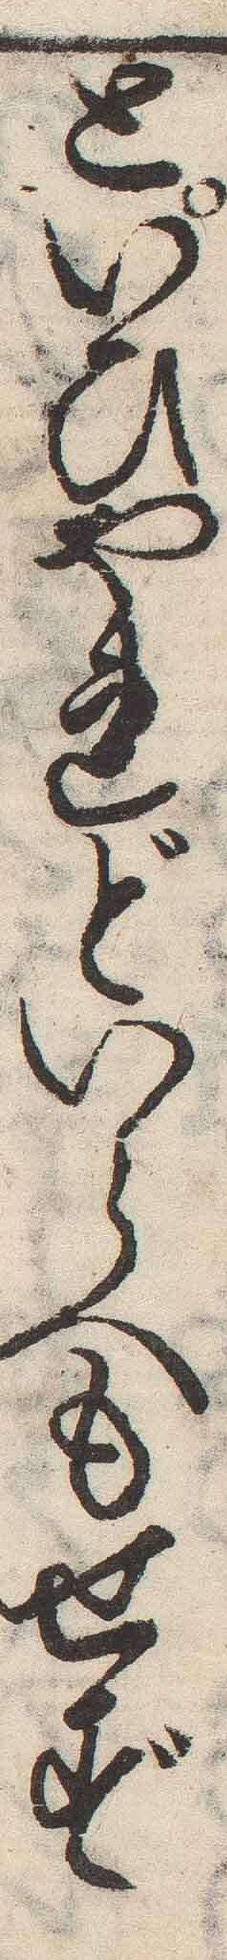と。いひやれどいらへもせず
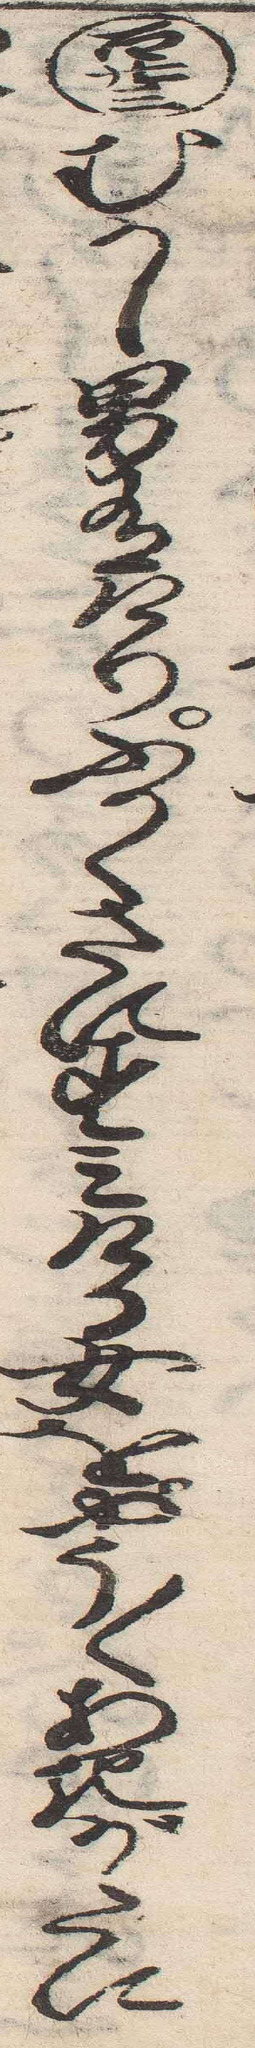百廿三むかし男有けり。ふかくさにすみける女をやう〳〵あきがたに
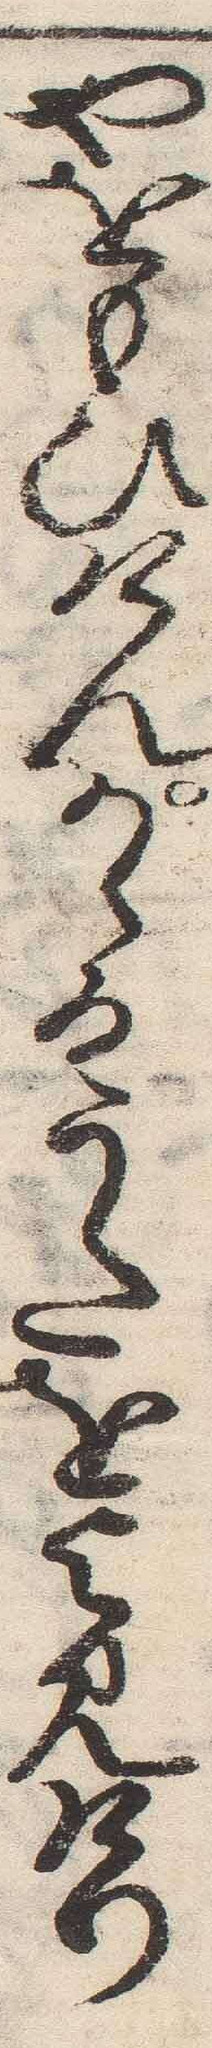やをもひけん。かゝるうたをよみけり
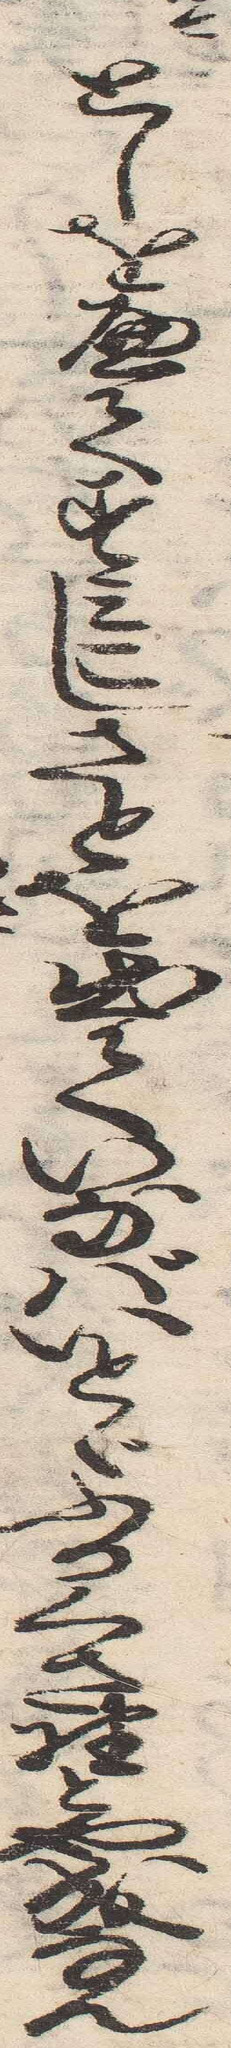古今としをへてすみこしさとを出ていなばいとゞふかくさ野とや成なん
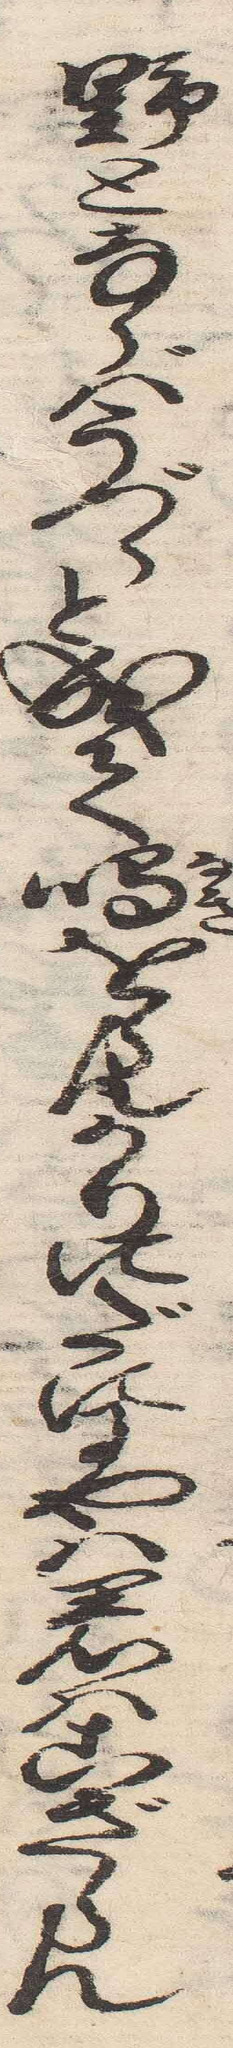同野とならばうづらと成て鳴をらんかりにだににやは君はこざらん
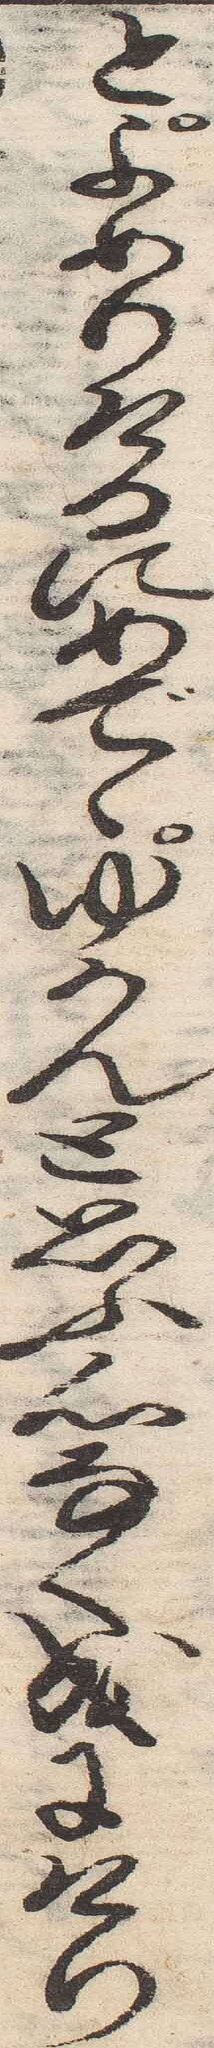と。よめりけるにめでゝ。ゆかんと思ふ心なく成にけり
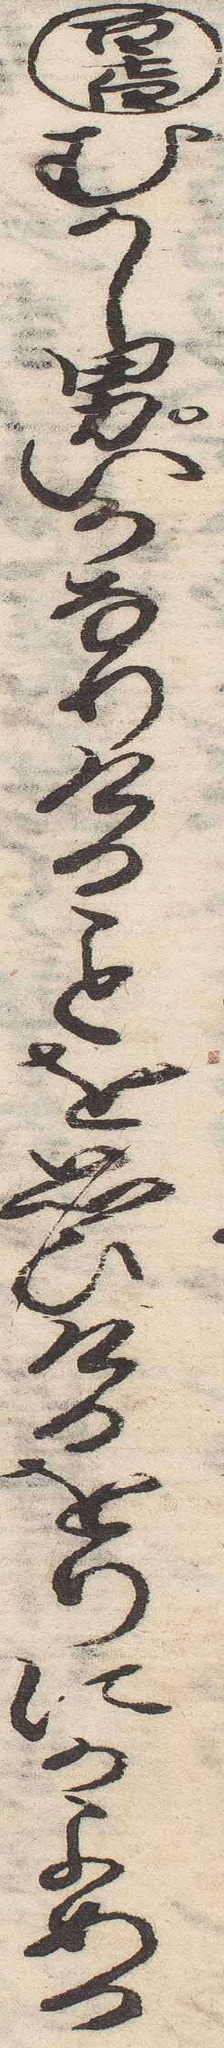百廿四むかし男。いかなりけることを思ひけるをりにかよめる
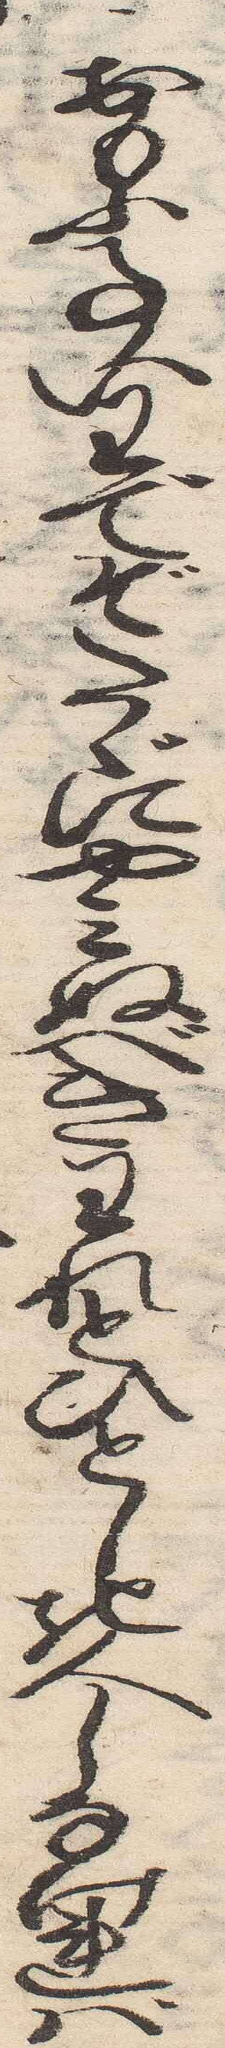おもふ事いわでぞたゞにやみぬべきわれとひとしき人しなければ
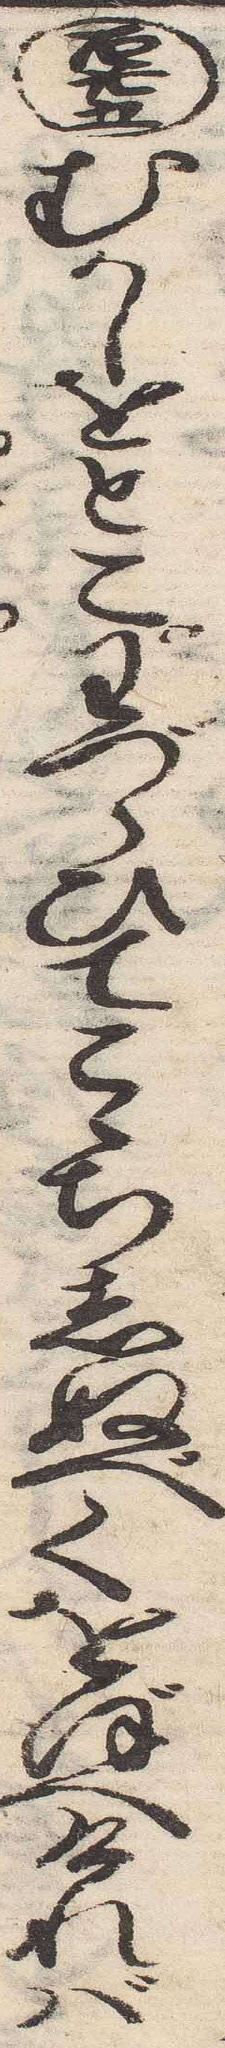百廿五むかしをとこ。わづらひてこゝちしぬべくをぼへければ
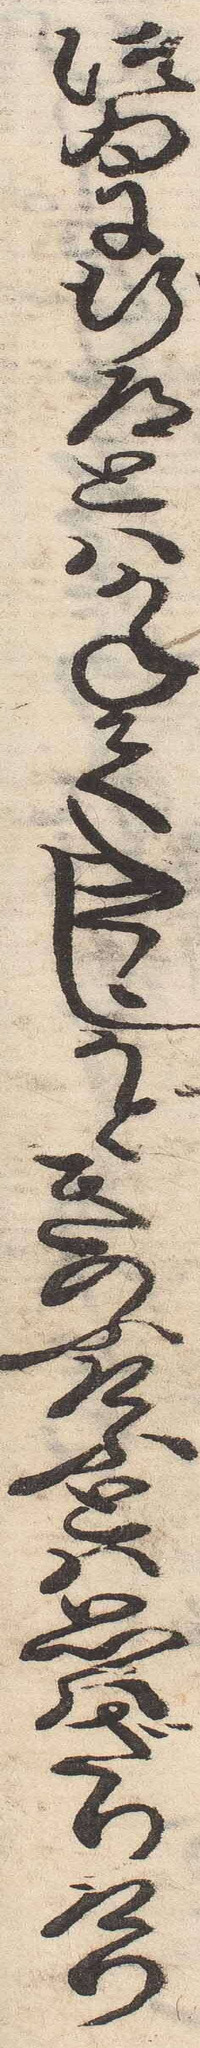つゐに行道とはかねてきゝしかどきのふけふとは思はざりけり
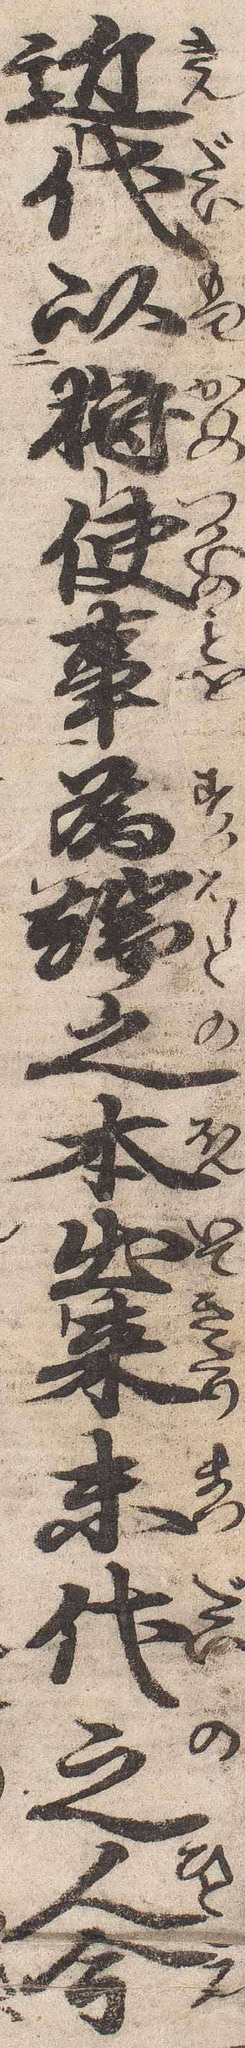近-代以狩-使-事為端之本出-来末代之人今
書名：伊勢物語
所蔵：東京学芸大学附属図書館 国文学研究資料館
